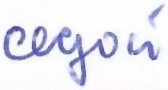седой
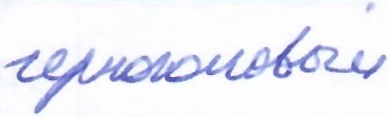черноголовый
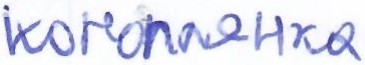коноплянка
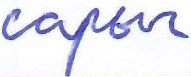сарыч
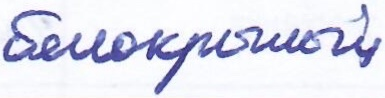белокрылый
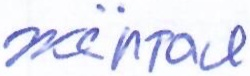жёлтая
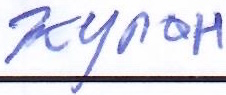кулан
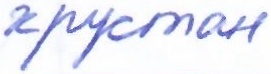хрустан
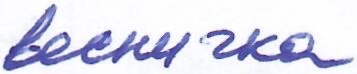весничка
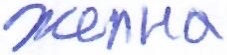желна
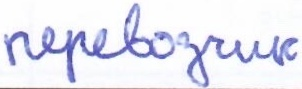перевозчик
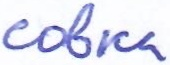совка
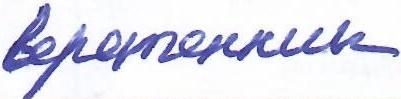веретенник
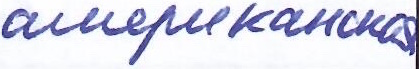американская
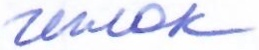чеглок
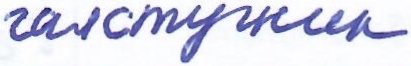галстучник
